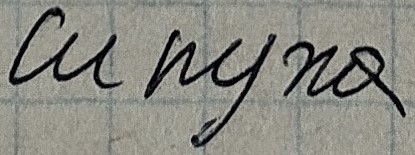сипуха
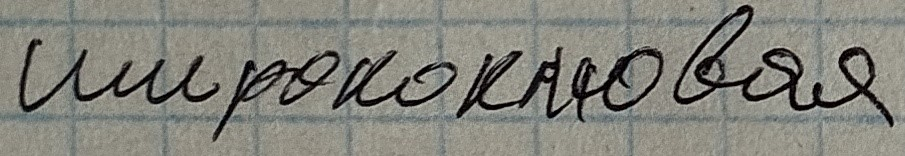ширококлювая
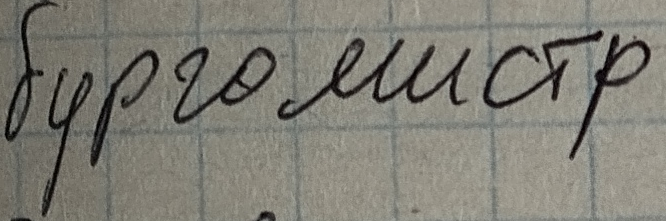бургомистр
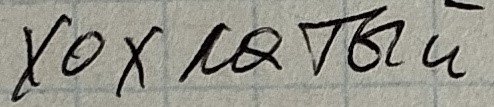хохлатый
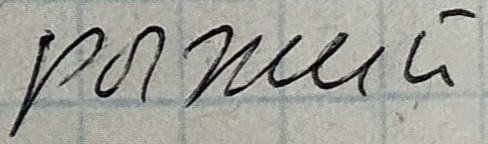рыжий
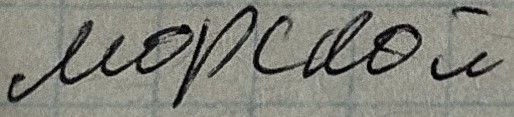морской
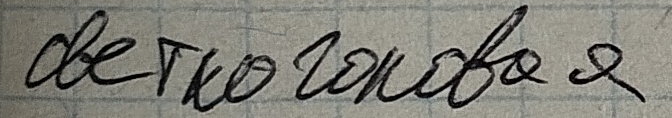светкоголовая
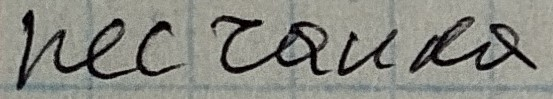песчанка
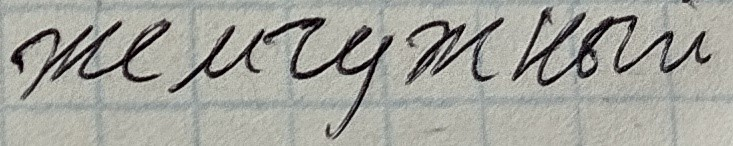жемчужный
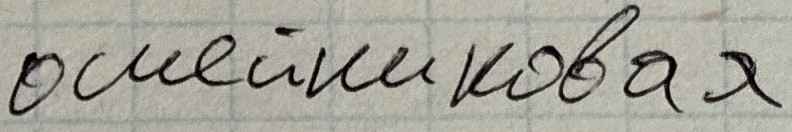ошейниковая
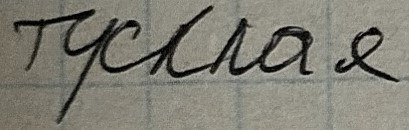тусклая
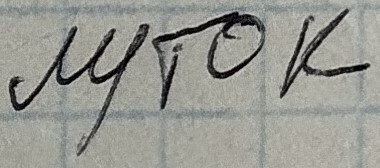луток
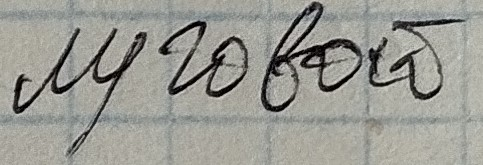луговой
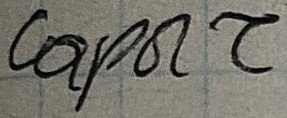сарыч
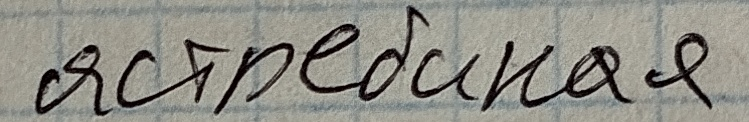ястребиная
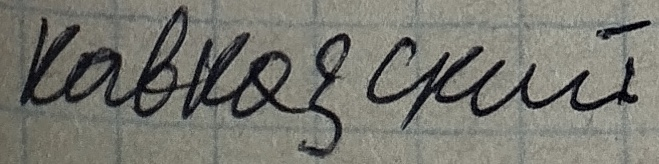кавказский
